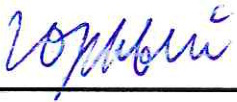горный
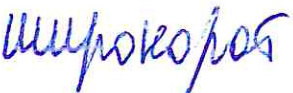широкорот
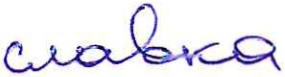славка
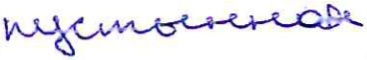пустынная
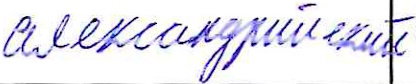александрийский
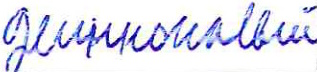длиннопалый
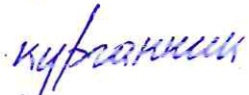курганник
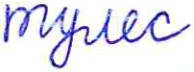тулес
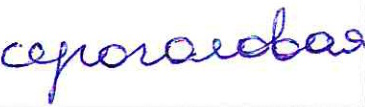сероголовая
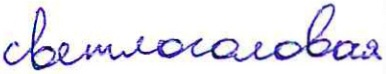светлоголовая
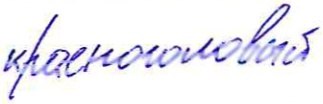красноголовый
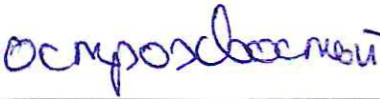острохвостый
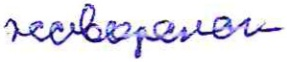жаворенок
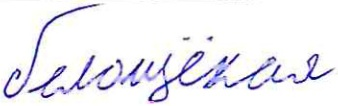белощёкая
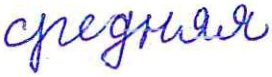средняя
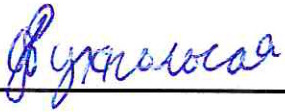двухполосая
